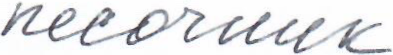песочник
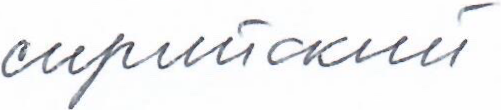сирийский
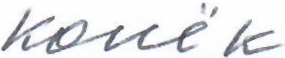конёк
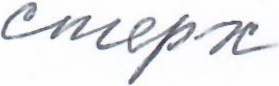стерх
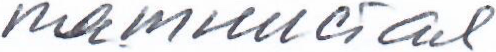пятнистая
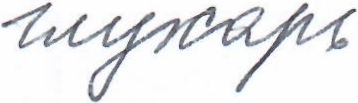глухарь
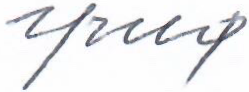гриф
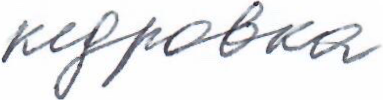кедровка
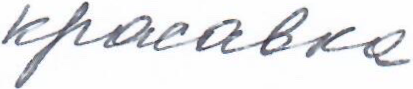красавка
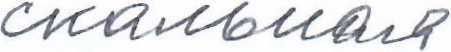скальная
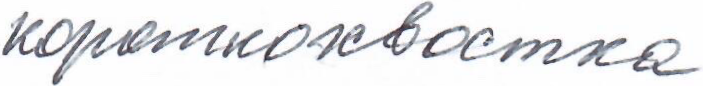короткохвостка
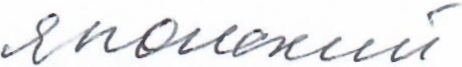японский
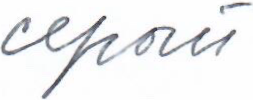серый
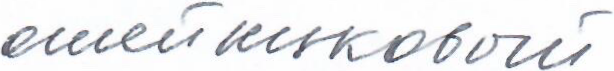ошейниковый
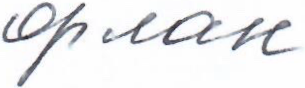орлан
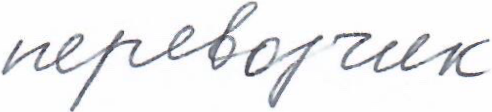перевозчик
